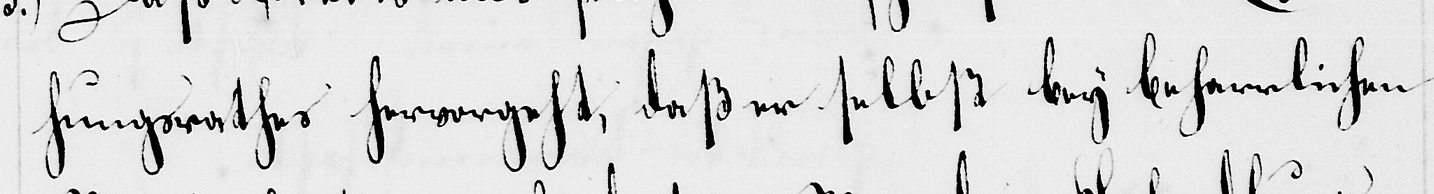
hungsrathes hervorgeht, daß er selbst bey beharrlichen
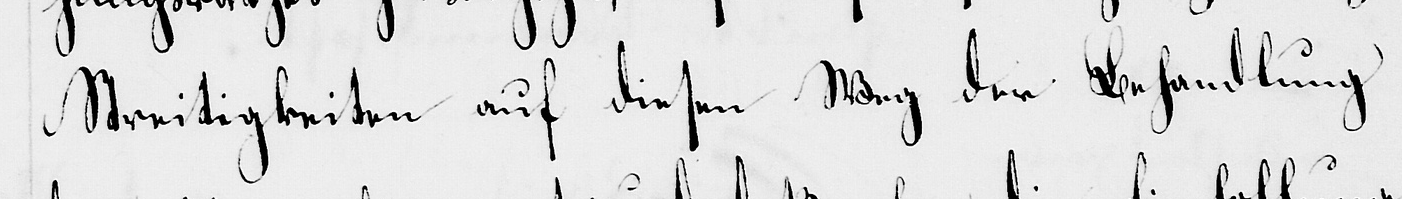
Streitigkeiten auf diesen Weg der Behandlung
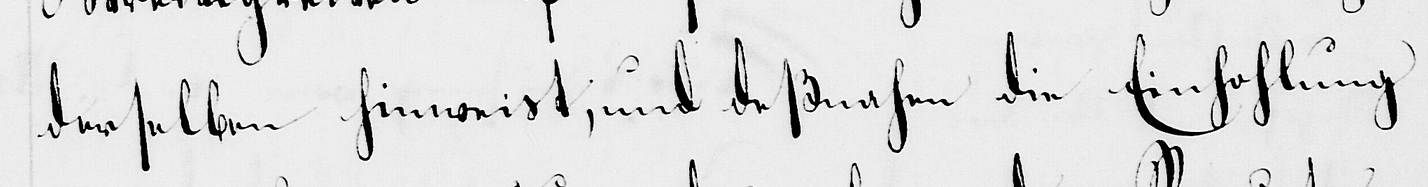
derselben hinweist, und deßnahen die Einhohlung
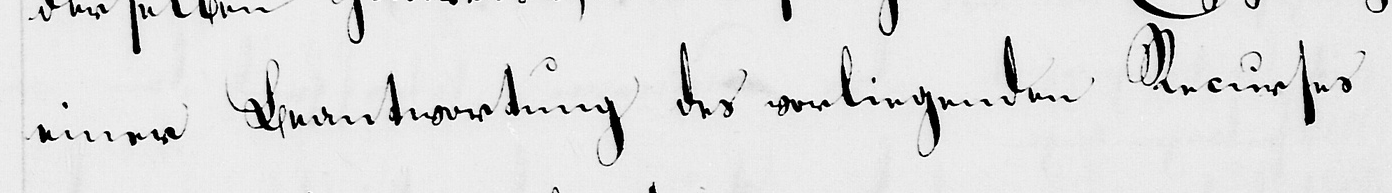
einer Beantwortung des vorliegenden Recurses
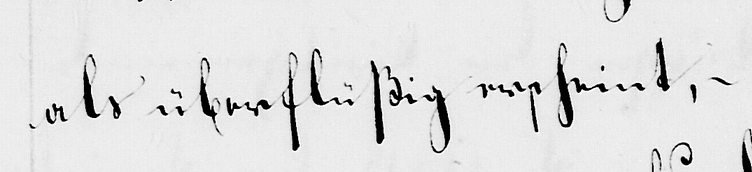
als überflüßig erscheint, –
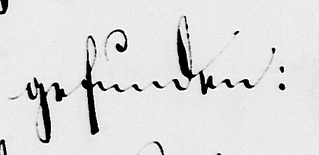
gefunden:
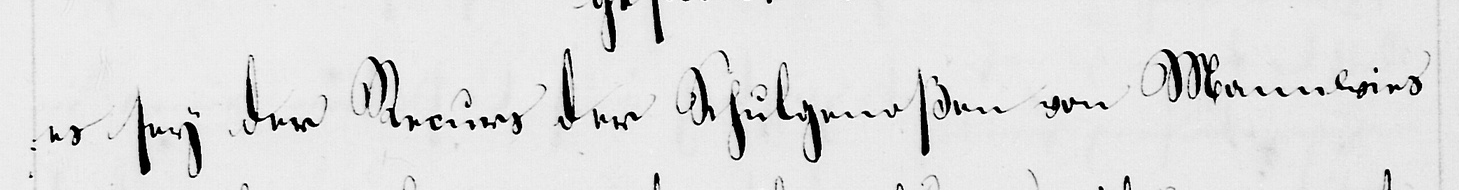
es sey der Recurs der Schulgenoßen von Mannwies
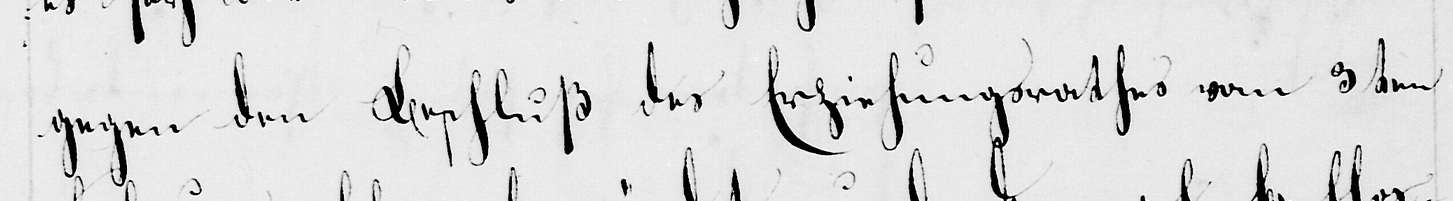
gegen den Beschluß des Erziehungsrathes vom 3ten
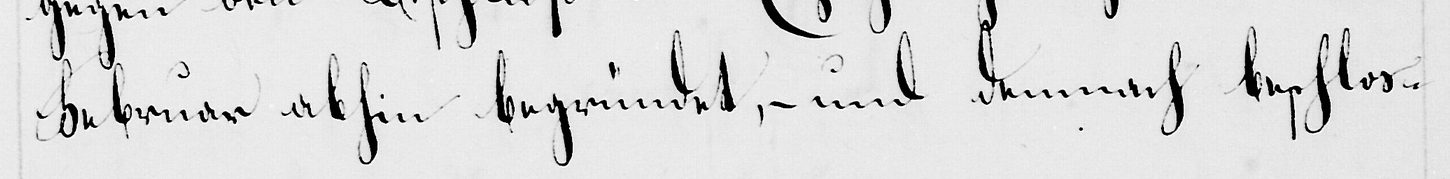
Februar abhin begründet, – und demnach beschlos¬
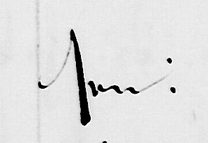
sen:
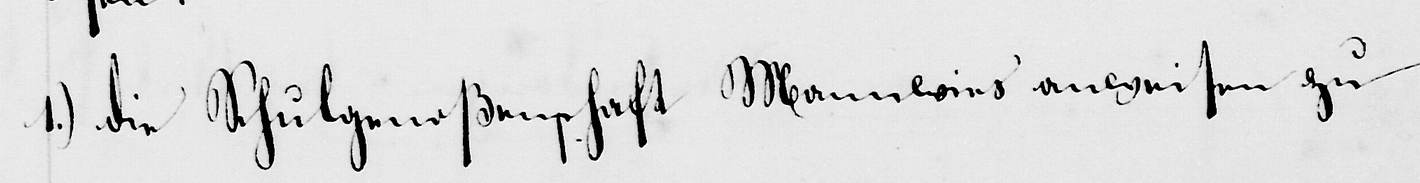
1.) die Schulgenoßenschaft Mannwies anweisen zu
